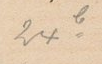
Berne
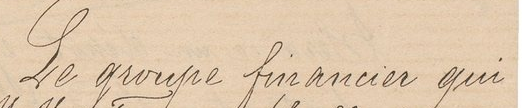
Le groupe financier qui
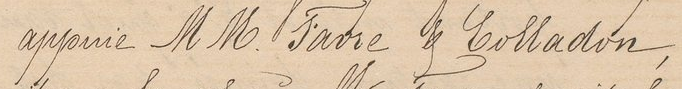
appuie MM. Favre & Colladon,
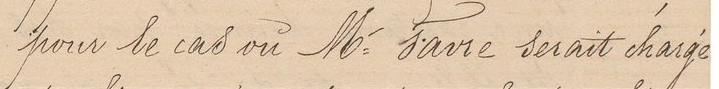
pour le cas où MrFavre serait chargé
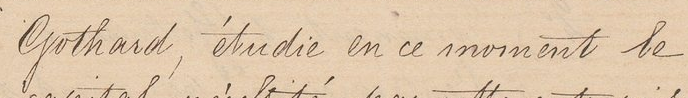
Gothard, étudie en ce moment le
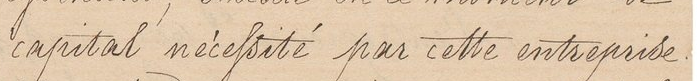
capital nécessité par cette entreprise.
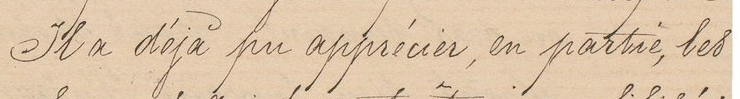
Il a déjà pu apprécier, en partie, les
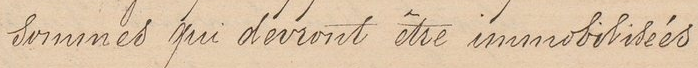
sommes qui devront être immobilisées
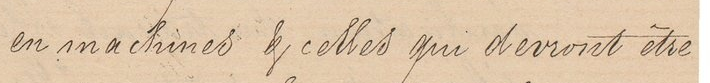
en machines & celles qui devront être
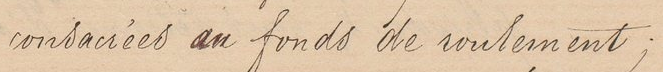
consacrées au fonds de roulement;
